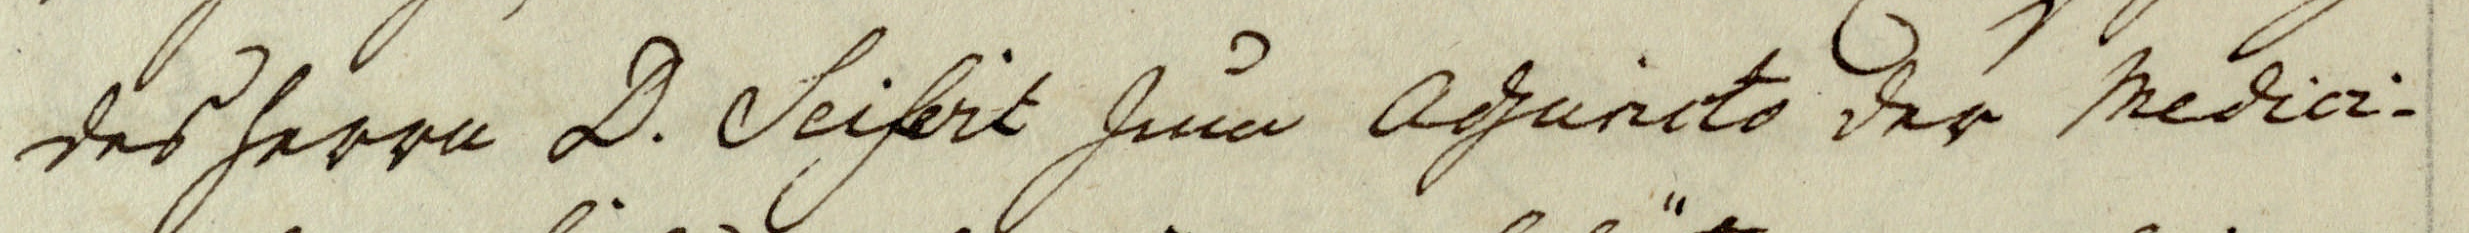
des Herrn D. Seifert zum Adjuncto der Medici¬
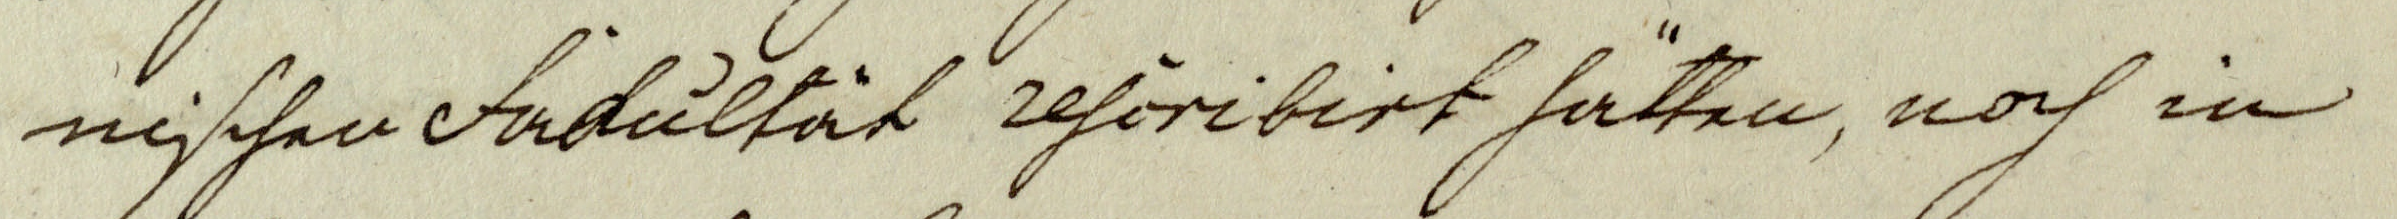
nischen Fakultät rescribirt hätten, noch in
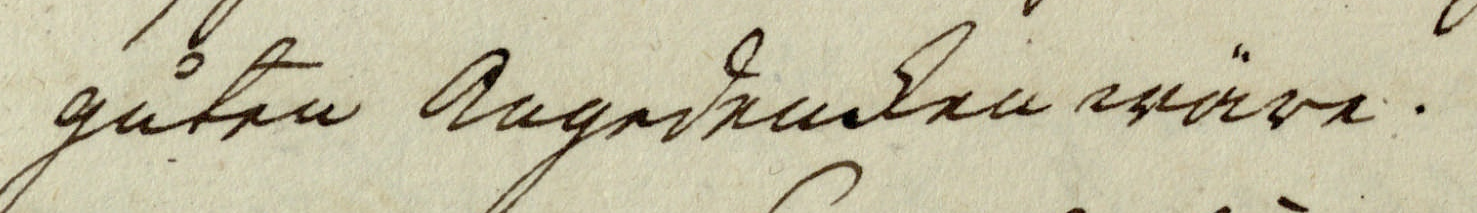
guten Angedenken wäre.
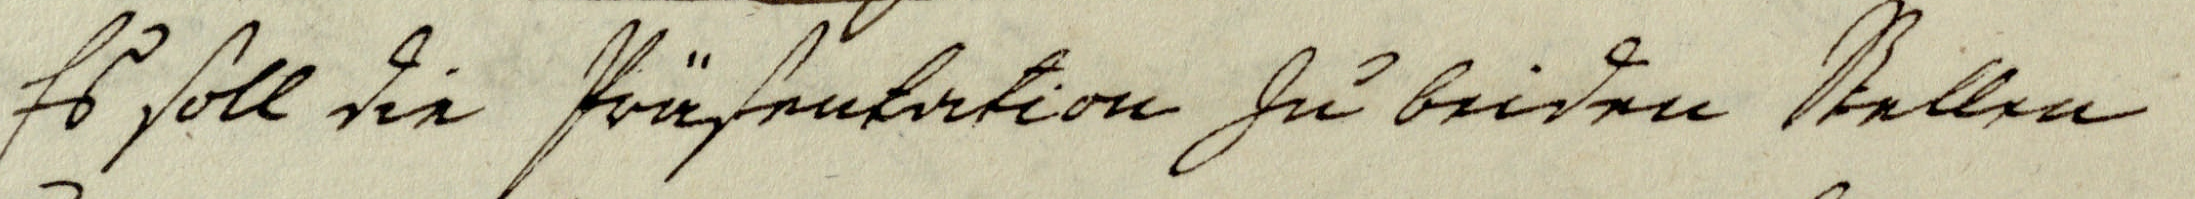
Es soll die Präsentation zu beiden Stellen
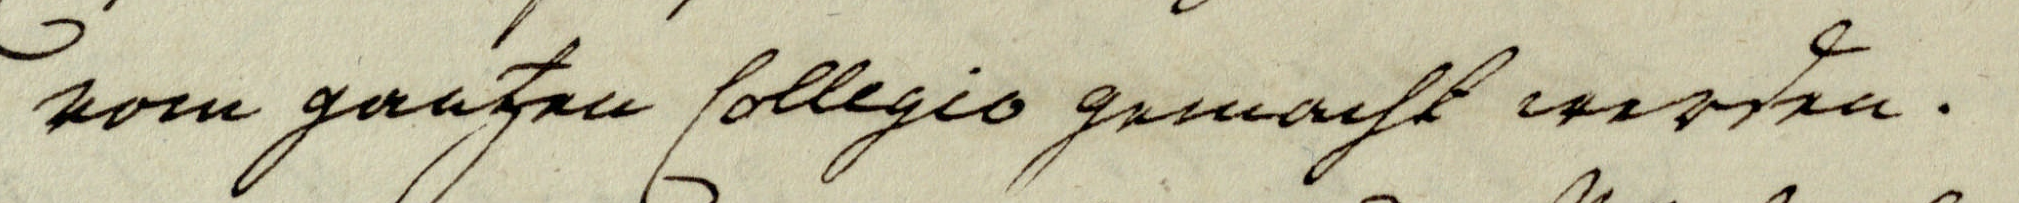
vom gantzen Collegio gemacht werden.
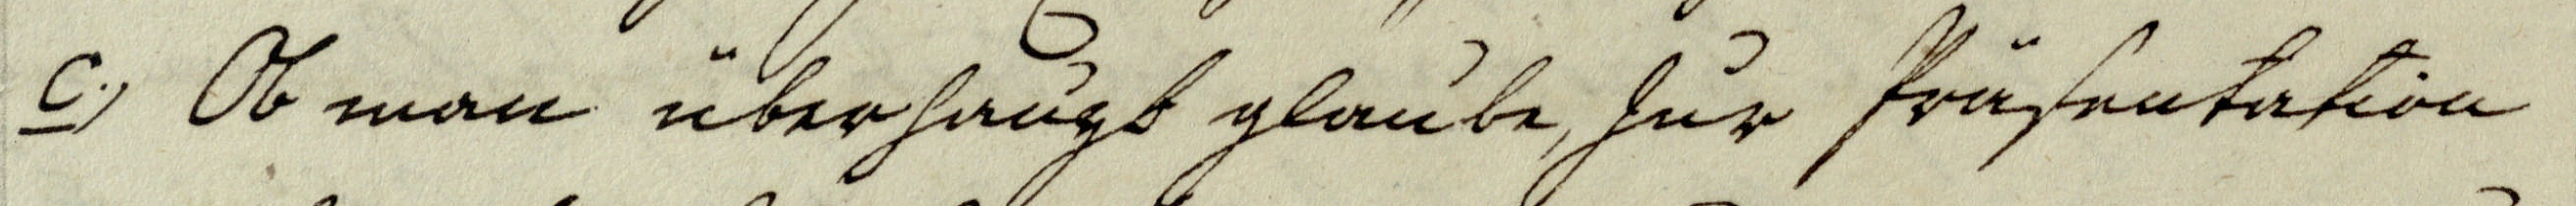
c., Ob man überhaupt glaube, zur Präsentation
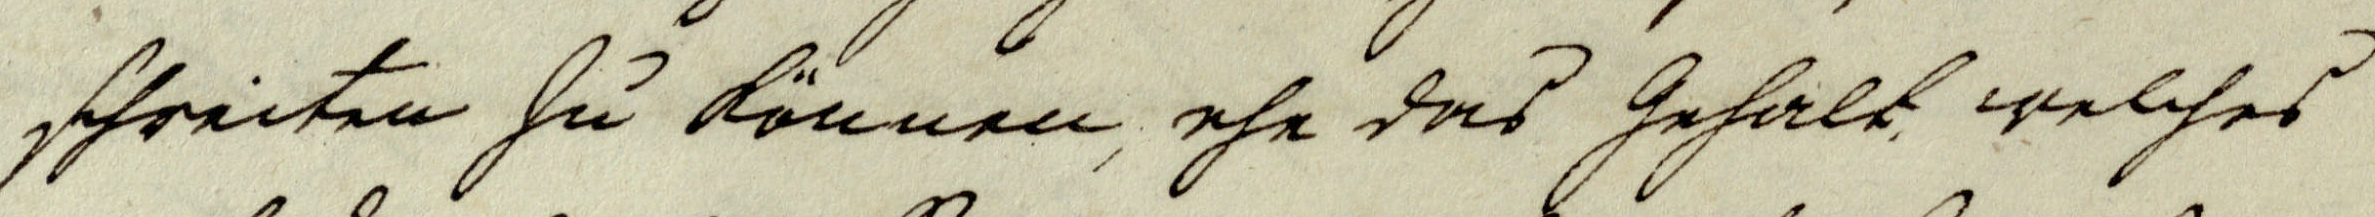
schreiten zu können, ehe das Gehalt welches
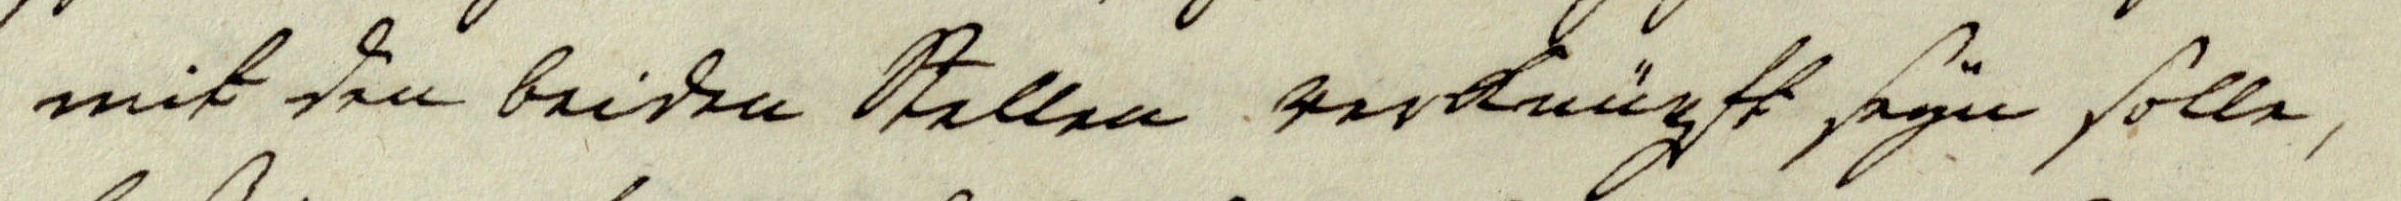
mit den beiden Stellen verknüpft seÿn solle,
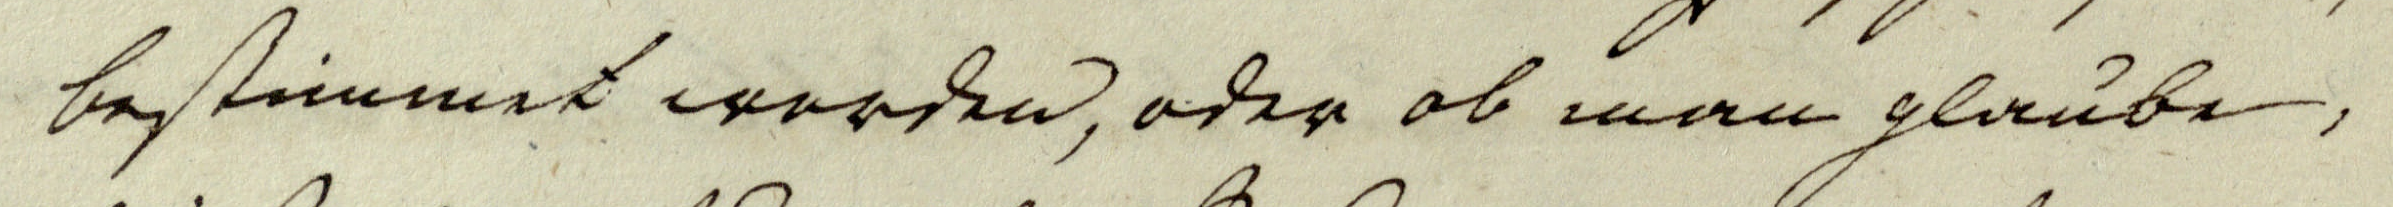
bestimmt worden, oder ob man glaube,
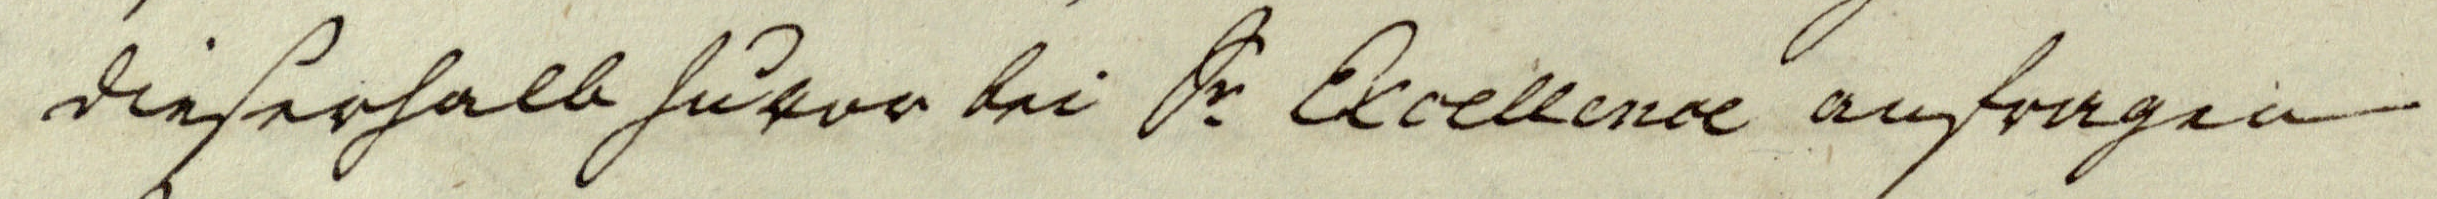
dieserhalb zuvor bei Sr. Excellence anfragen
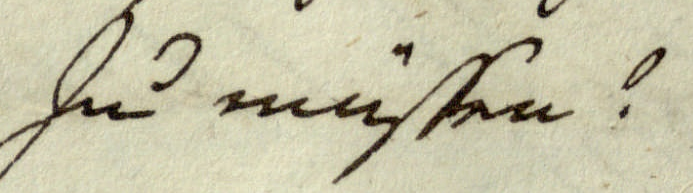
zu müssen?
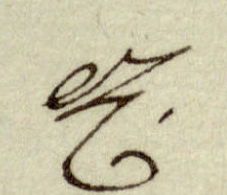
dh.
